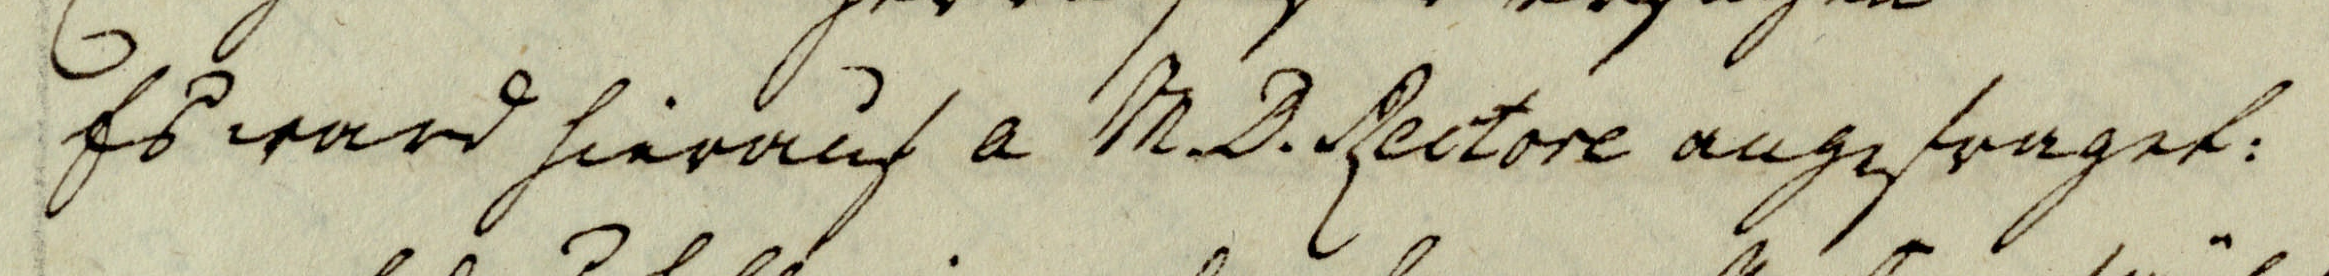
Es ward hierauf a M. D. Rectore angefraget:
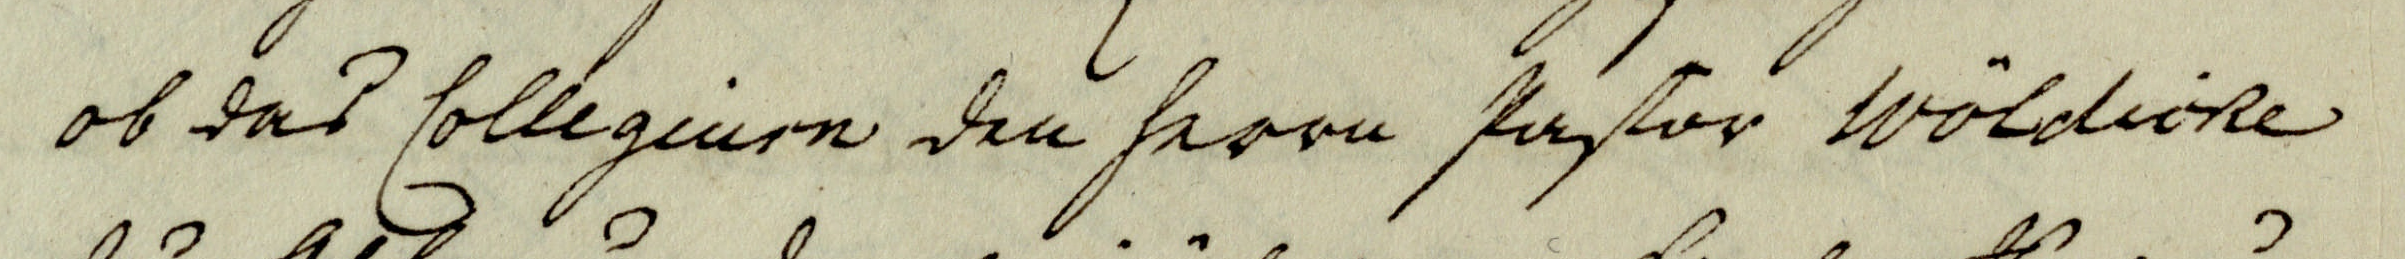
ob das Collegium den Herrn Pastor Wöldicke
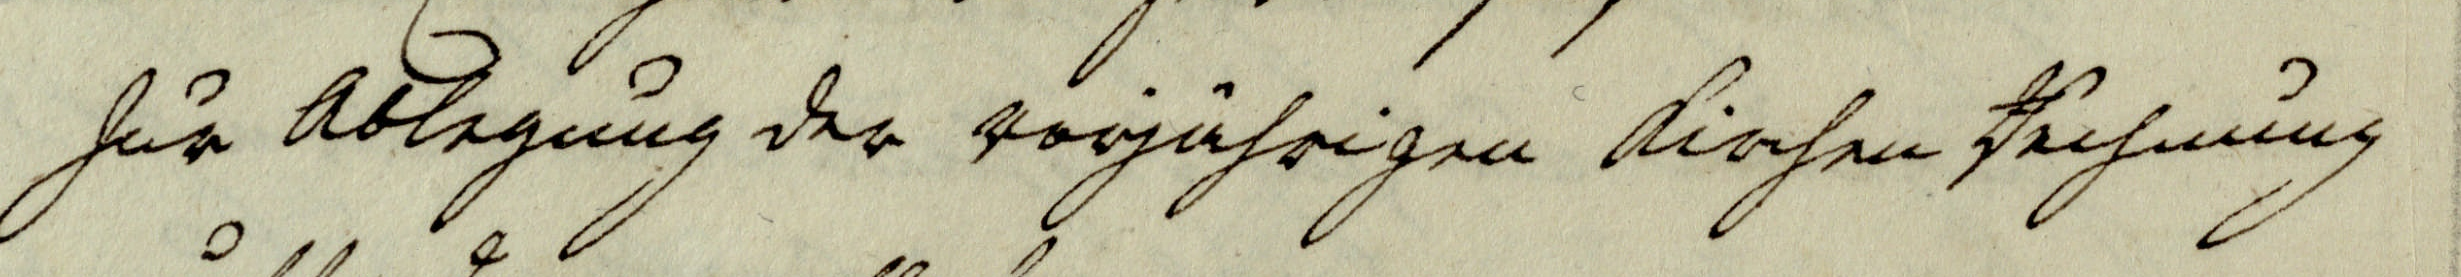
zur Ablegung der vorgjährigen Kirchen Rechnung
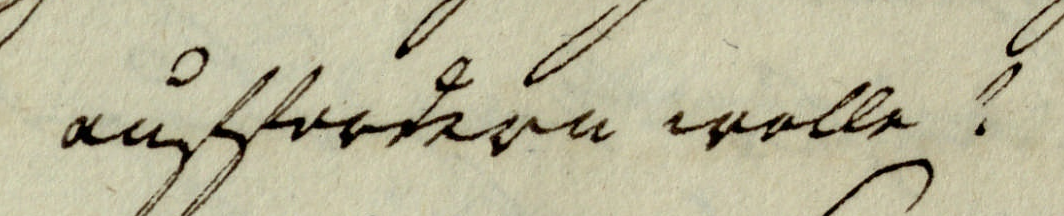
auffordern wolle?
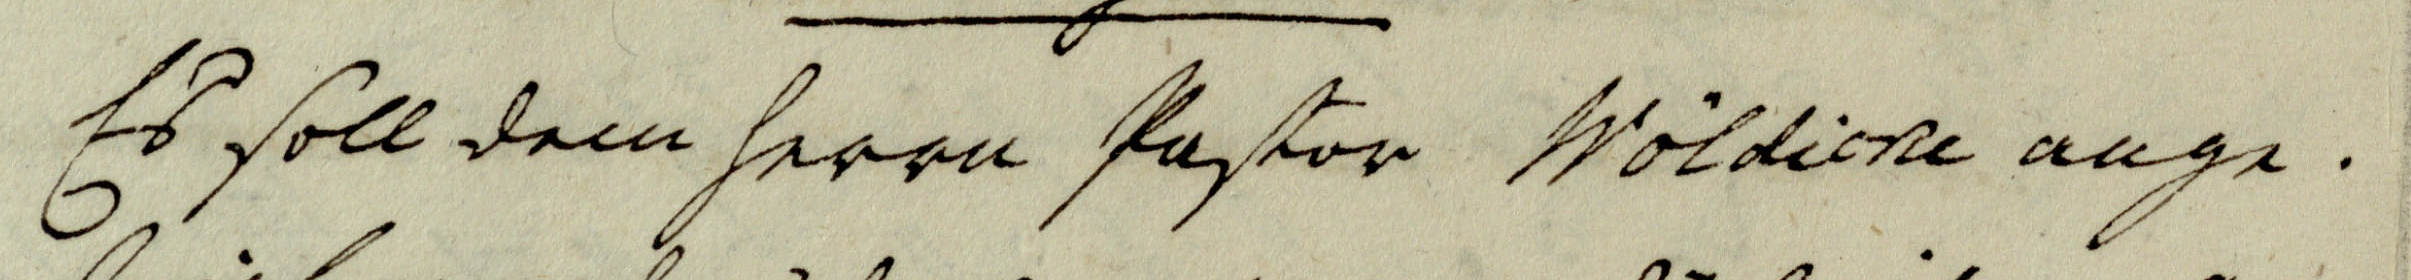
Es soll dem Herrn Pastor Wöldicke ange¬
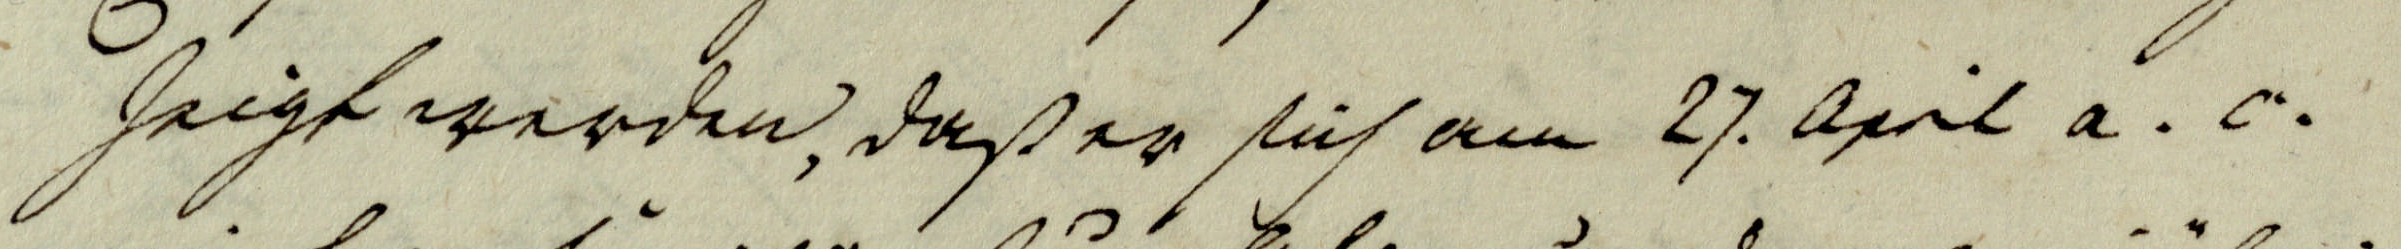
zeigt werden, daß er sich am 27. April a. c.
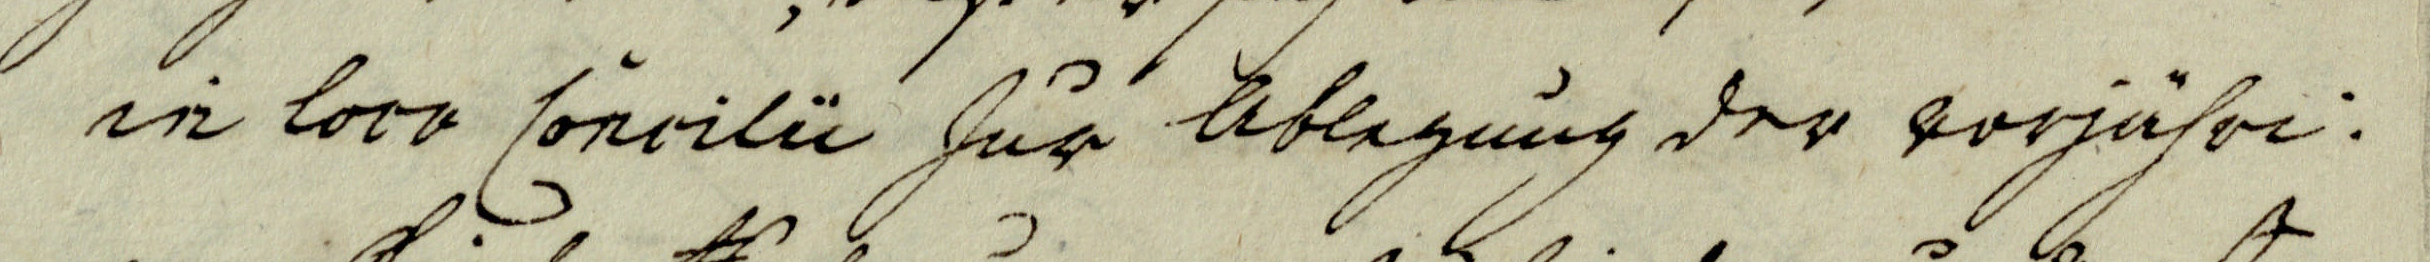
in loco Concilii zur Ablegung der vorjähri¬
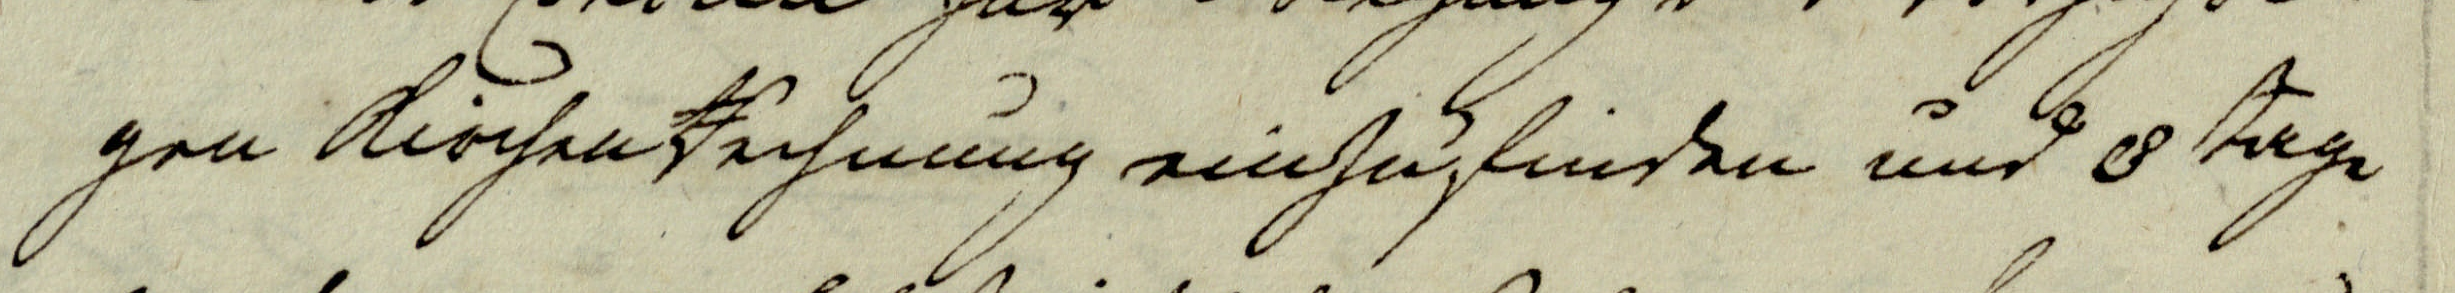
gen KirchenRechnung einzufinden und 8 Tage
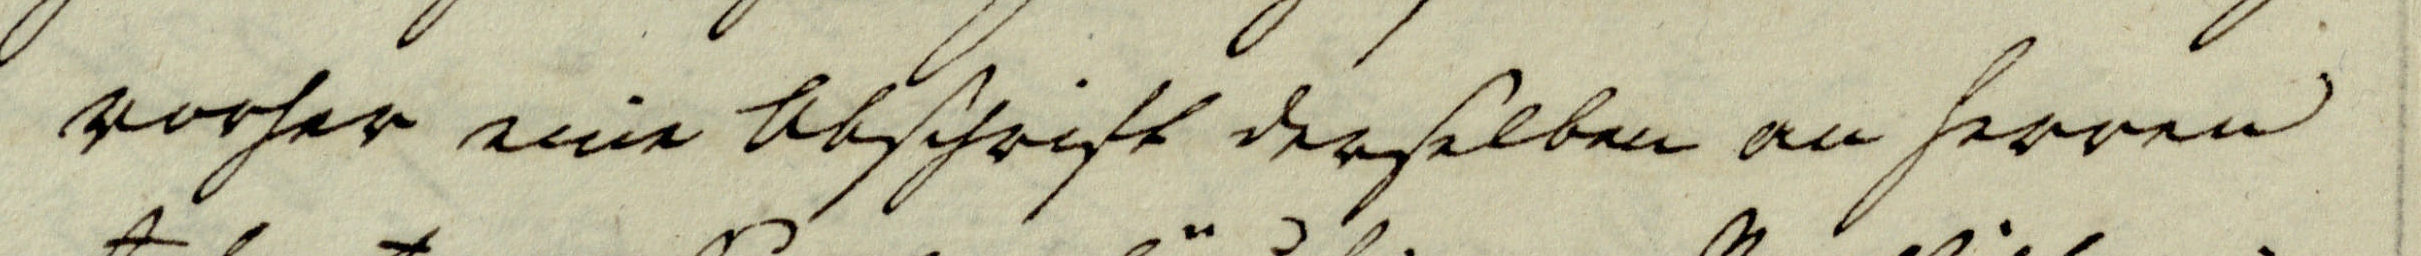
vorher eine Abschrift derselben an Herren
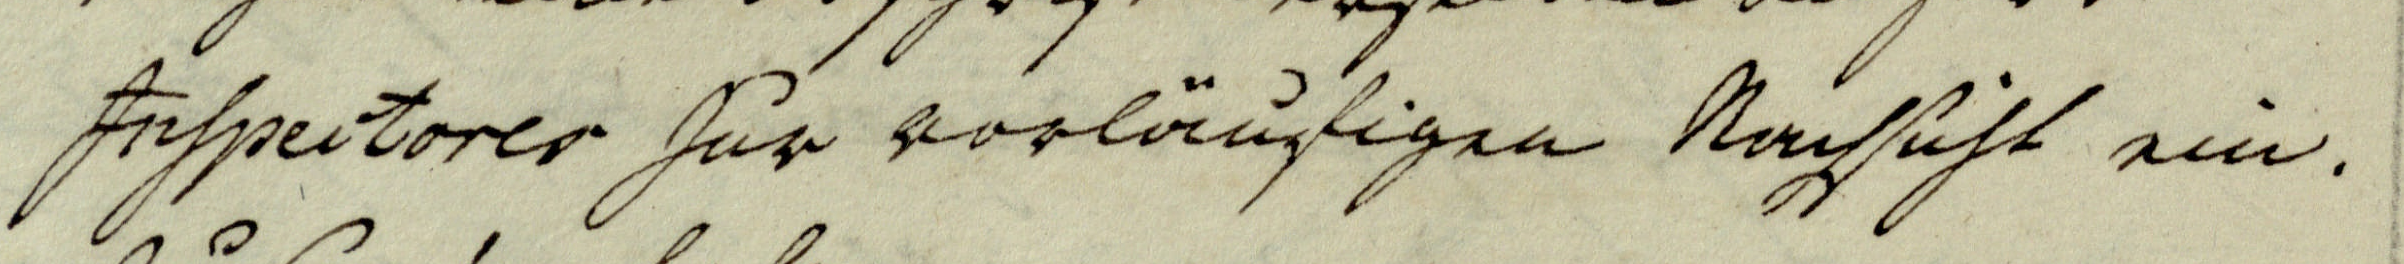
Inspectores zur vorläufigen Nachsicht ein¬
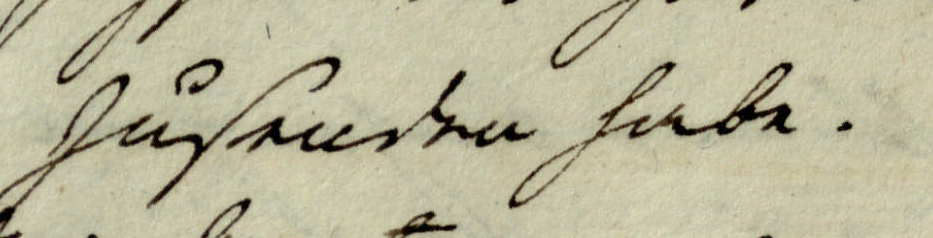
zusenden habe.
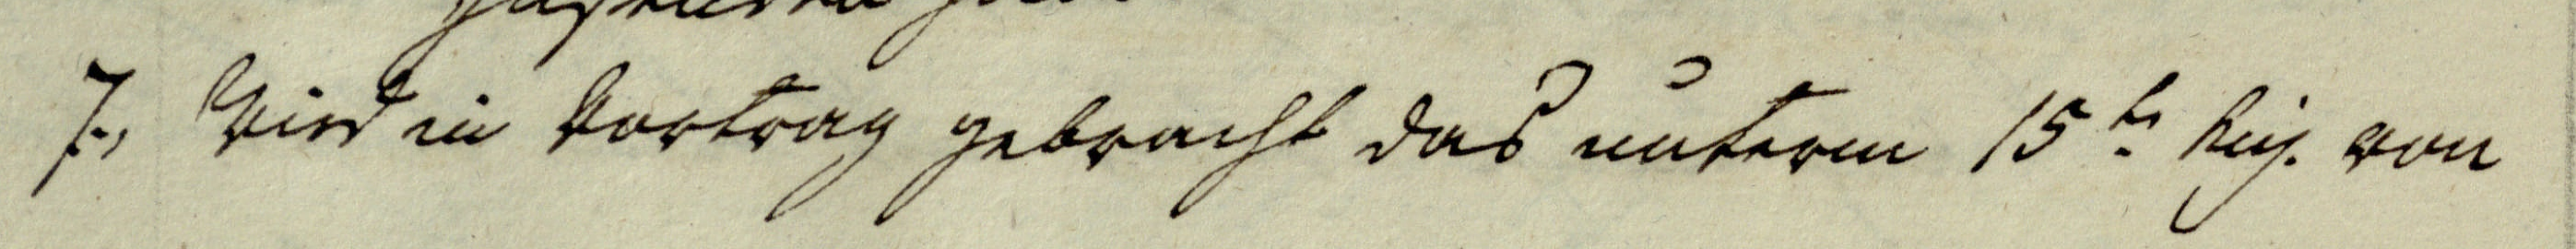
7., Wird in Vortrag gebracht das unterm 15 t. huj. von
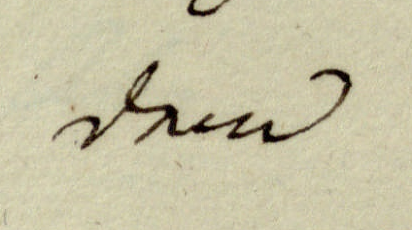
dem
